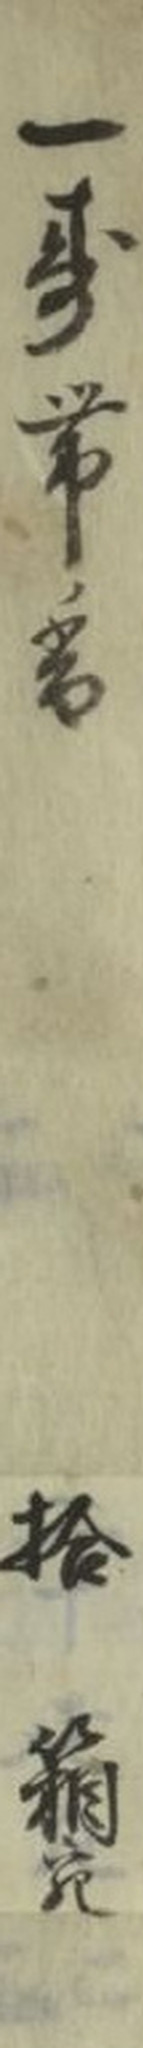一寿帯ノ香拾箱宛
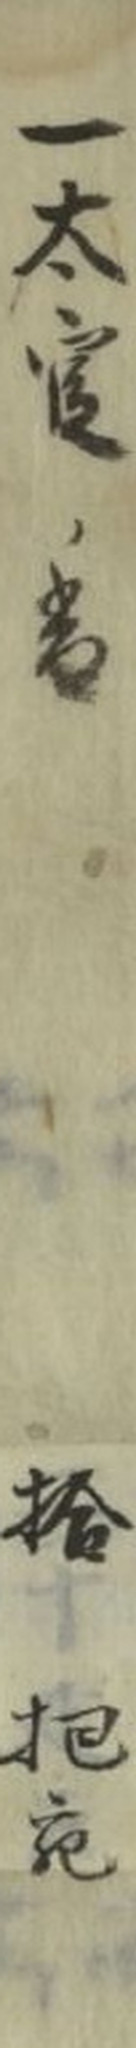一太官ノ香拾把宛
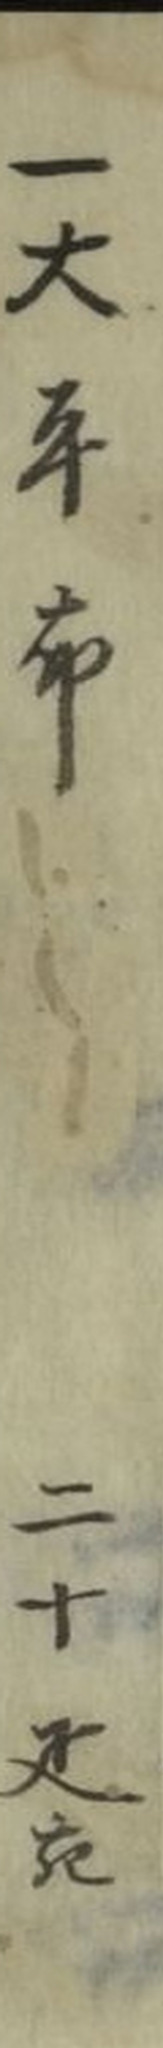一太平布二十疋宛

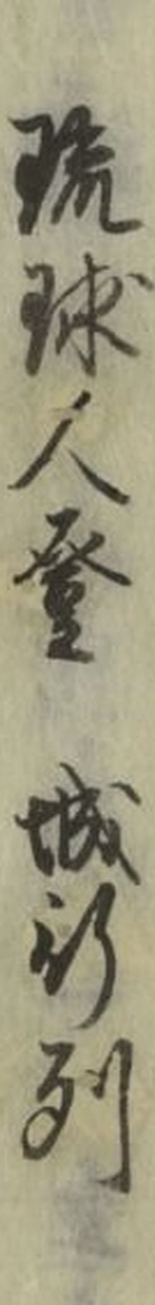琉球人登城行列

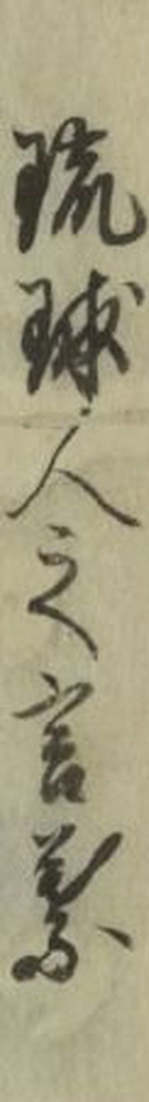琉球人の言葉
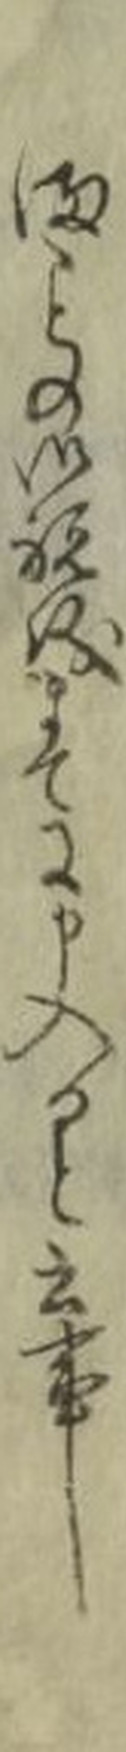到菫於礼酒ことの御祝儀まてに申入ると云事
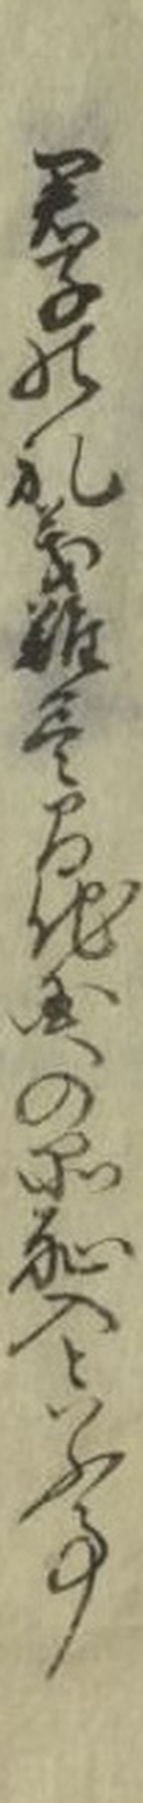不腆土誼君子の礼義尽間他国の品恐入といふ事
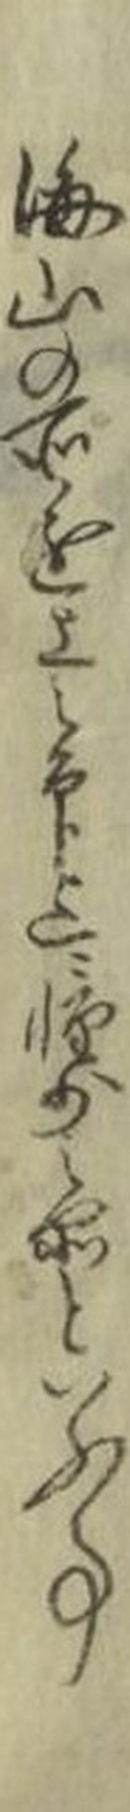遠忱海山の所進上之印迠に輕少之品といふ事
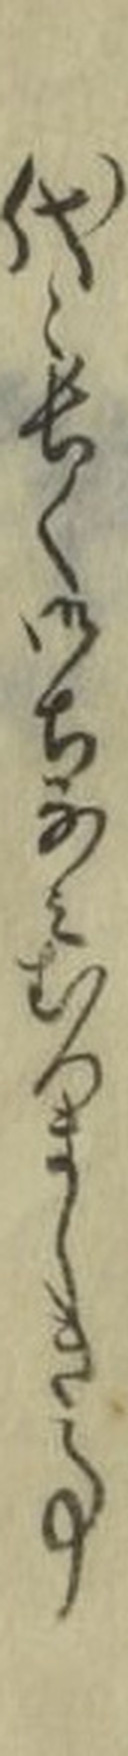厚舊好代々長く以ちなみむつましき事
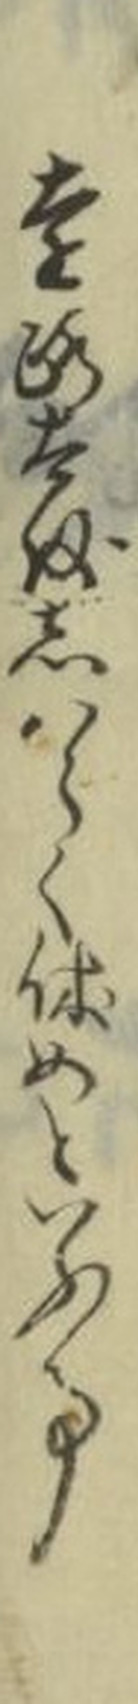休多労遠路大儀しはらく休めといふ事
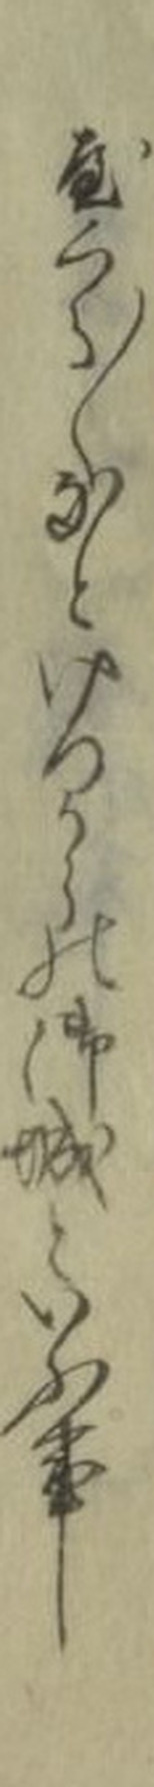雲楼臺やくら〳〵なとけつかうの御城といふ事
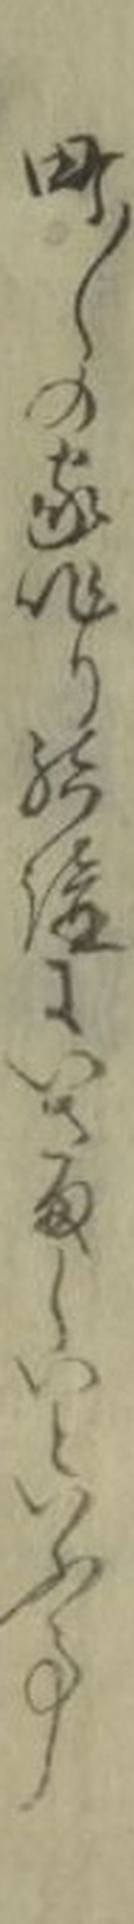千家府町〳〵の家作りにいさましいといふ事

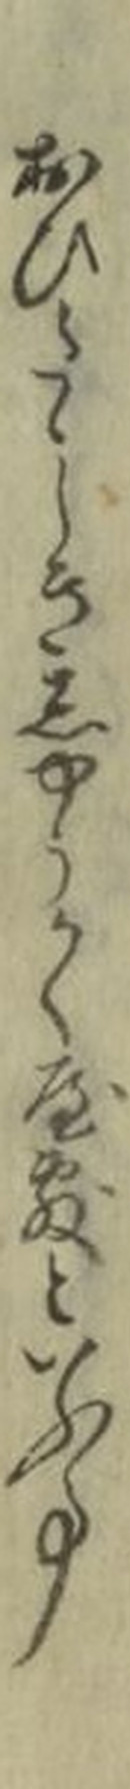鳳凰殿おひたゝしきしゆうらく屋敷といふ事
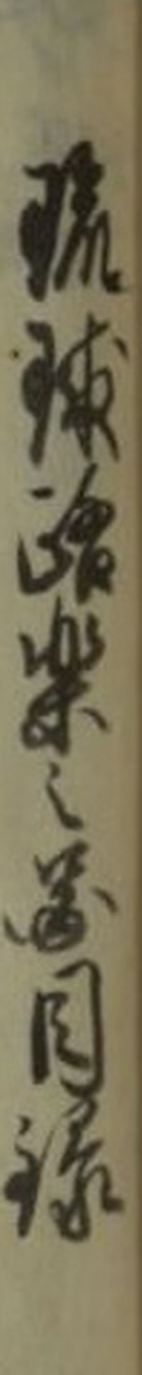琉球路楽之図目録
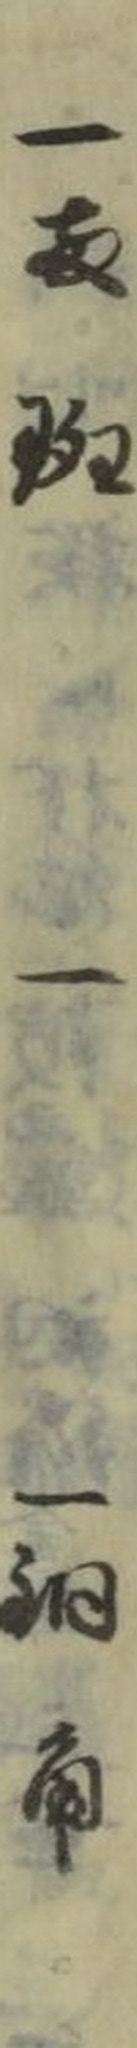一両班一一銅角二
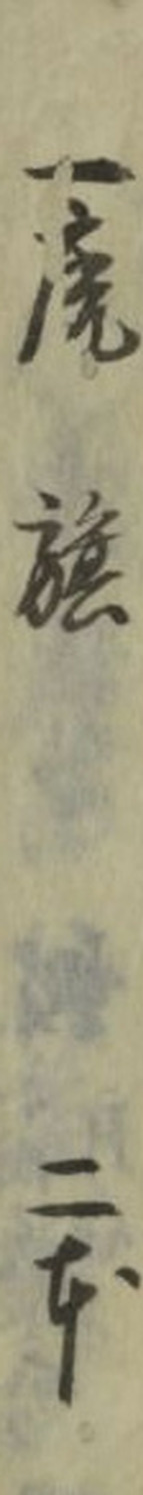一虎籏二本
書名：琉球人来朝之記
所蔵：University of the Ryukyus Library
